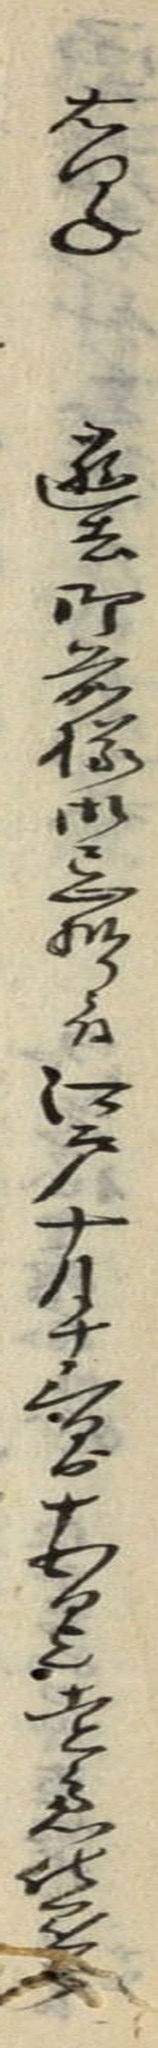右同年御逝去御前様御忌掛りに付江戸十月十三日ゟ十五日迄遠慮仕懸り
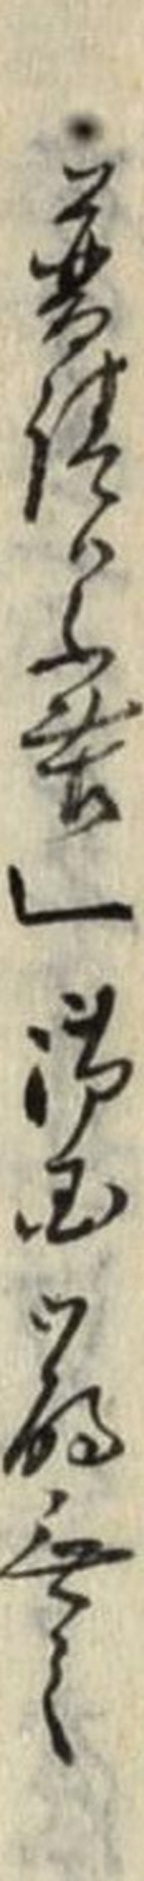普請は不苦」御国御触無之
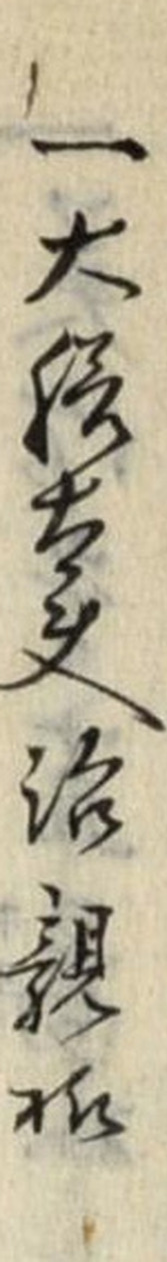一大膳大夫治親様
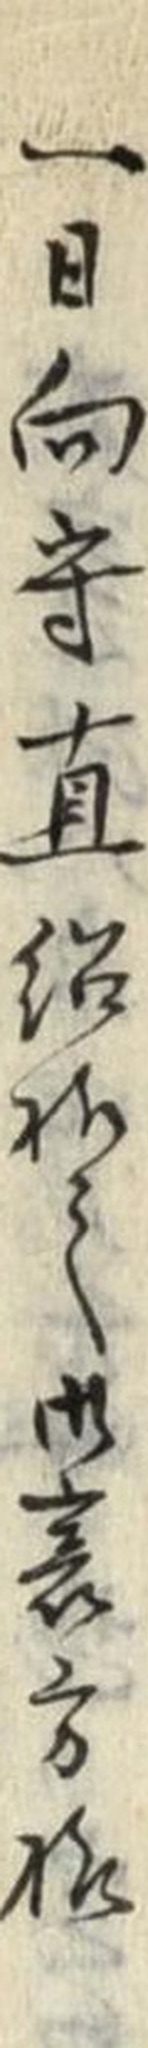一日向守直紹様之御裏方様
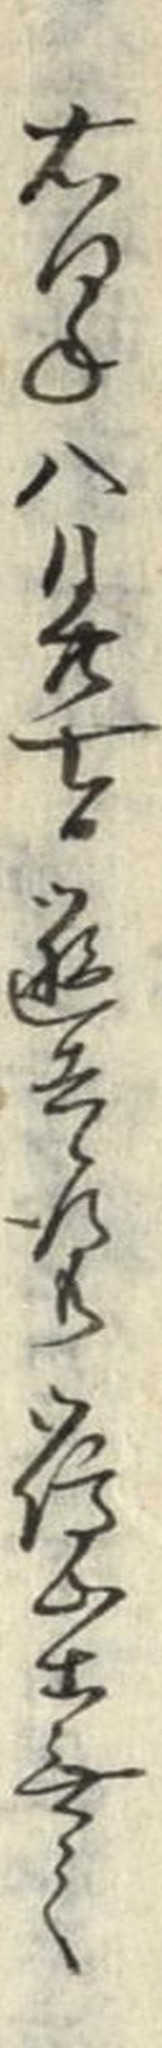右同年八月廿七日御逝去候得共御停止等無之
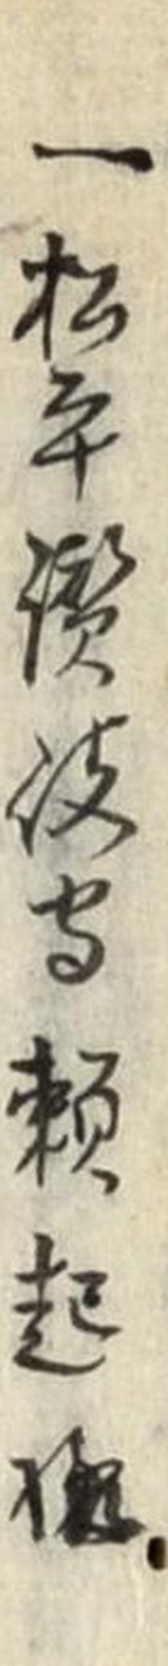一松平讃岐守頼起様
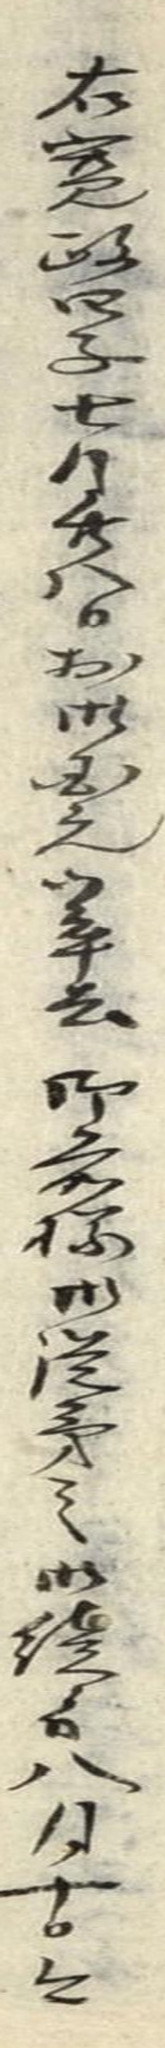右寛政四子七月廿八日於御国元御卒去御前様御従弟之御続に付八月十日今
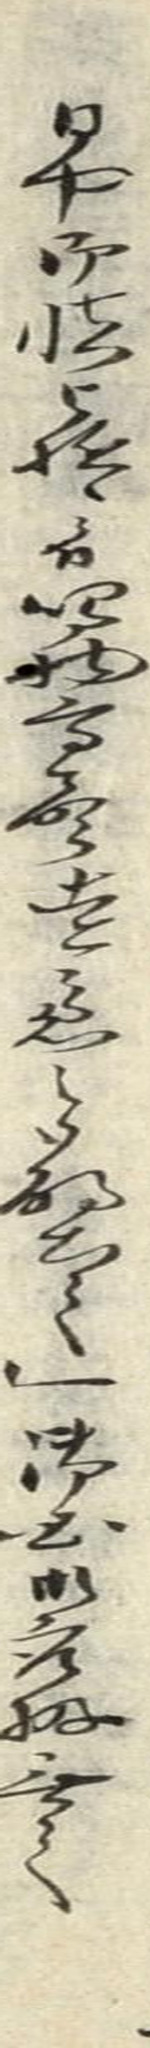日中御慎被遊候に付鳴物高声遠慮之御触出之」御国御取扱無之
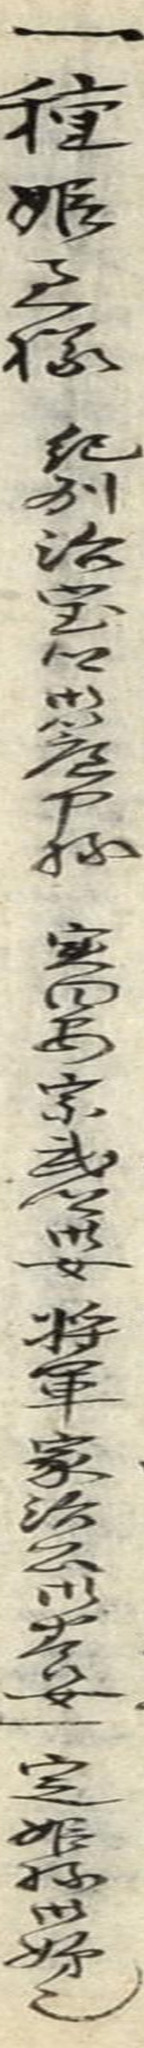一種姫君様紀州治宝卿御簾中様実田安宗武卿御女将軍家治公御養女」定姫様御姉也
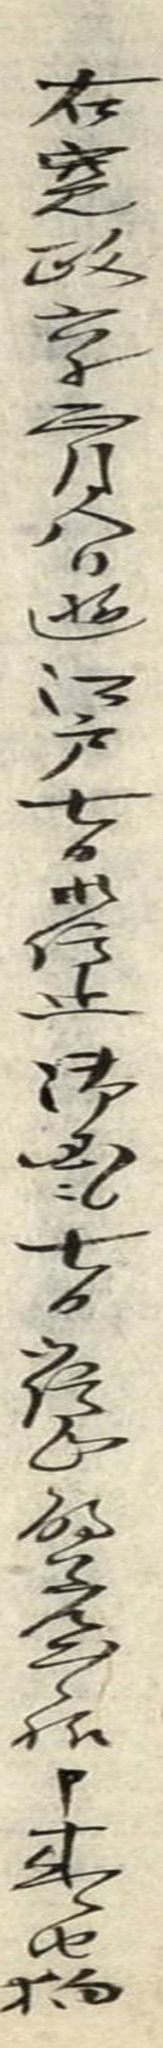右寛政六刁正月八日逝江戸七日御停止御国も七日御停止触差出候様申来候由狛
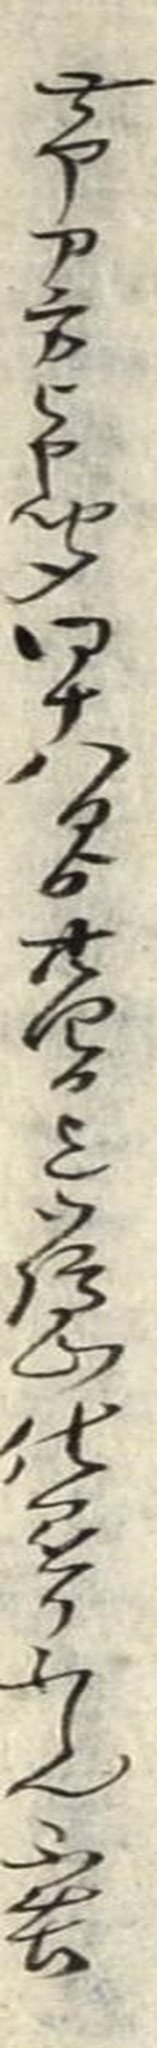帯刀方被申聞同十八日ゟ廿四日迄御停止仕懸りふしん不苦
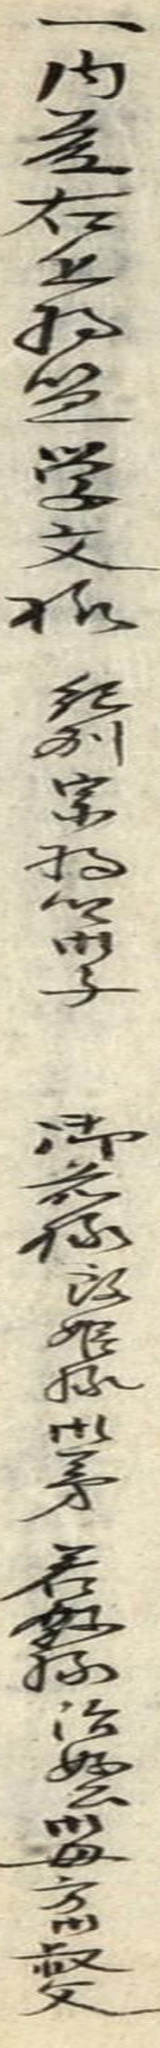一内藤右近将監学文様紀州宗将卿御子御前様致姫様御弟若殿様治好公御母方御叔父
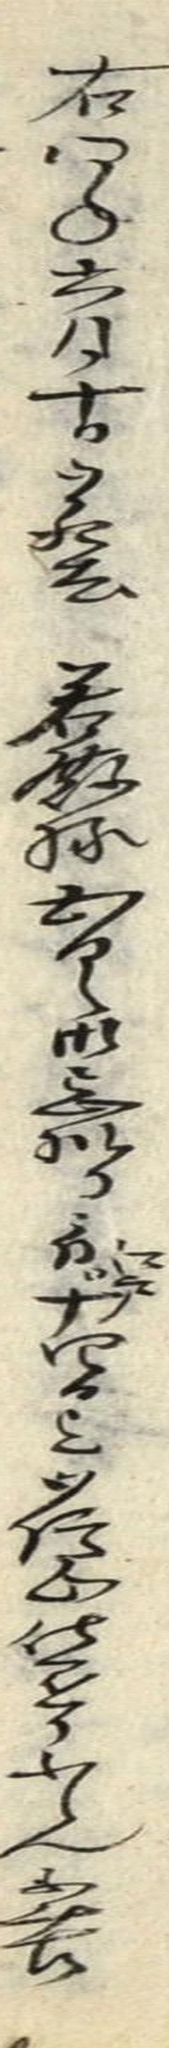右同年六月十日御死去若殿様五日之御忌掛りに付◦江戸十四日迄御停止仕懸りふしん不苦
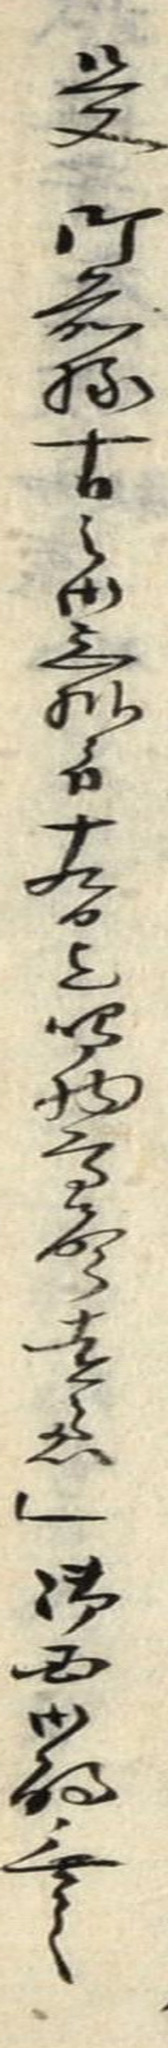且又御前様十日之御忌掛に付十九日迄鳴物高声遠慮」御国御触無之

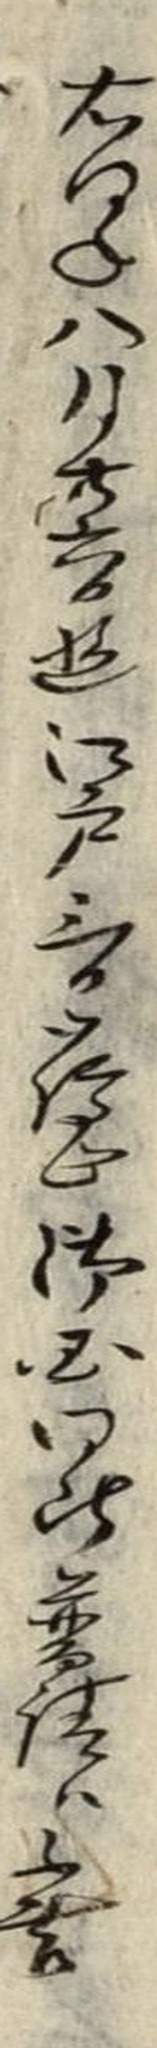右同年八月廿六日逝江戸三日御停止御国同断普請は不苦
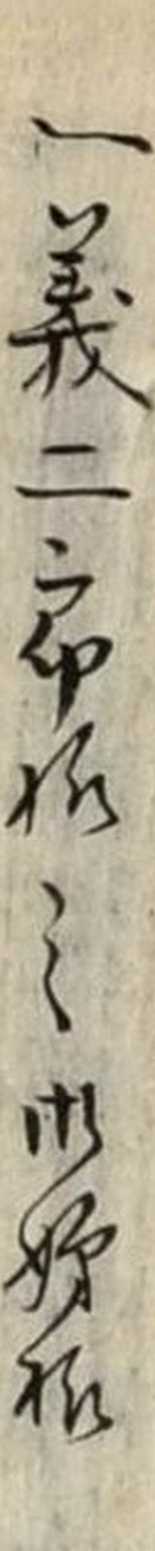一義二郎様之御姉様
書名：御停止異変死失
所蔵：福井県文書館 Fukui Prefectural Archives
